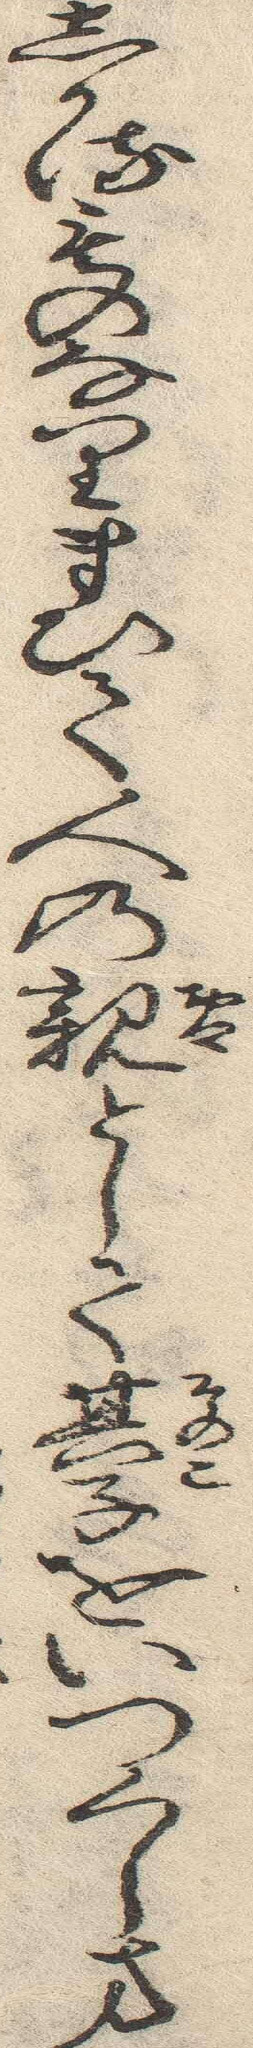しかるものなりまひて人の親として其子をいつくしま
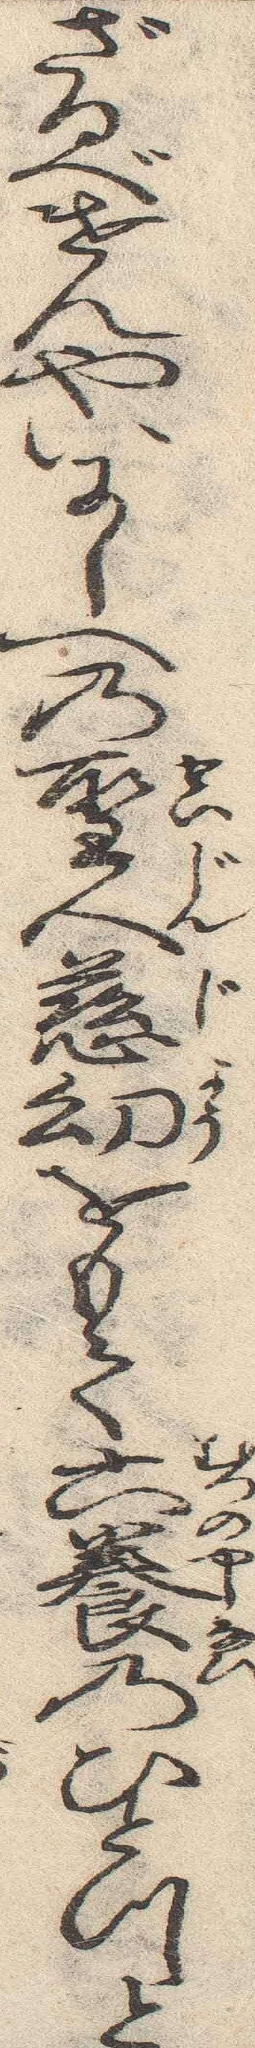ざるべけんやいにしへの聖人慈幼をもて六養のひとつと
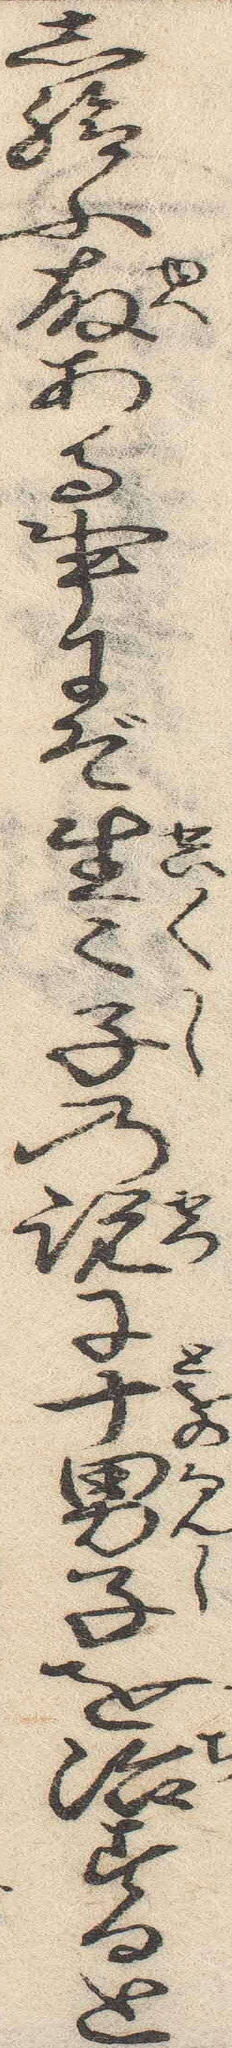し給ふ故ある事にぞ生〻子の説に十男子を治すると
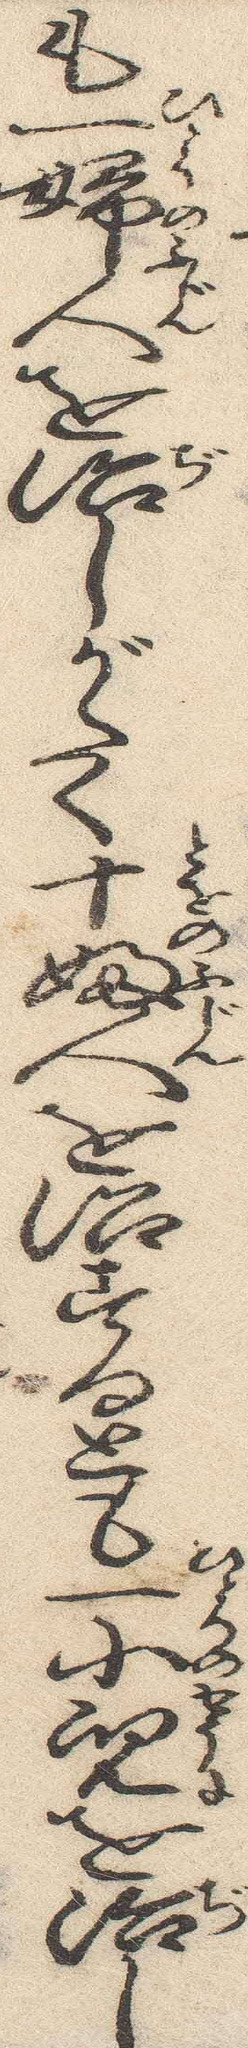も一婦人を治しがたく十婦人を治するとも一小児を治し
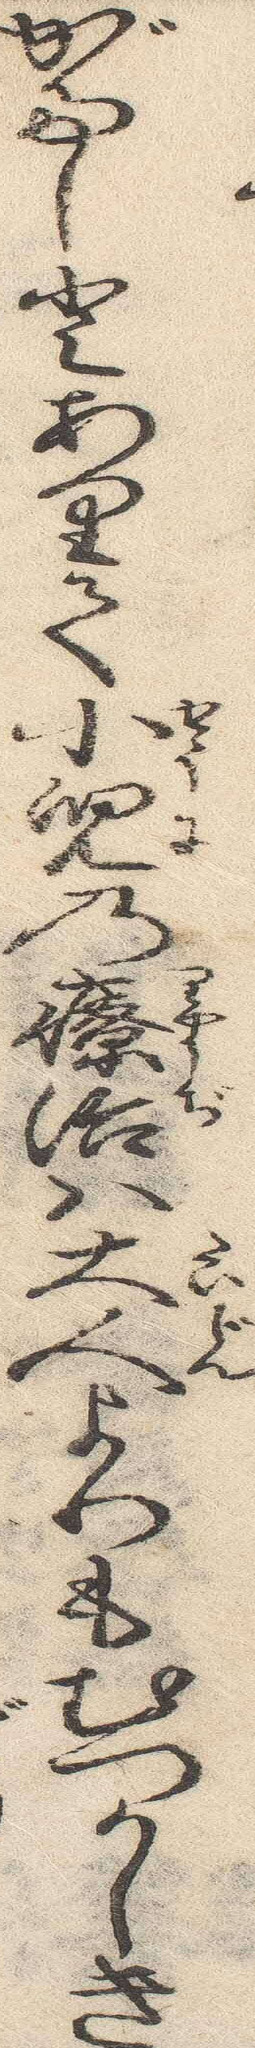がたしとありて小児の療治は大人よりもむつかしき
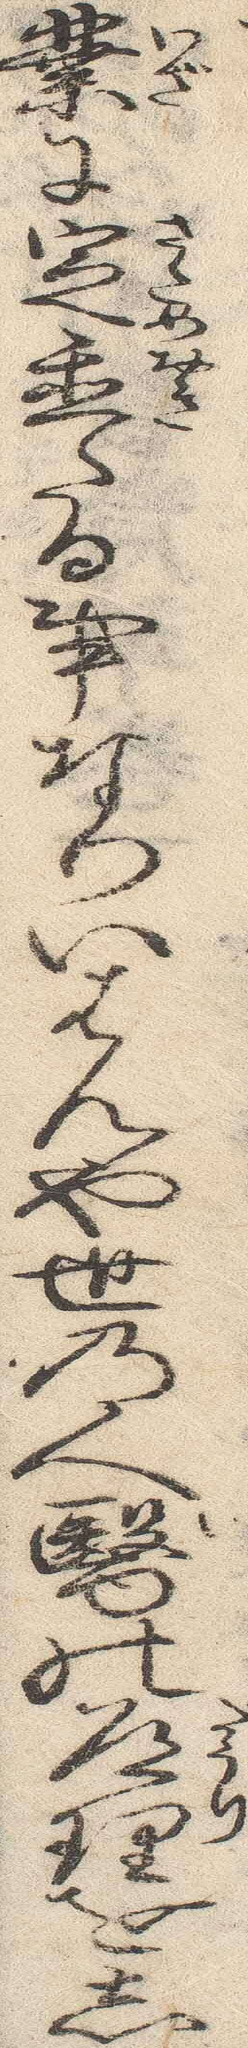業に定置たる事なりいはんや世の人醫の道理をし
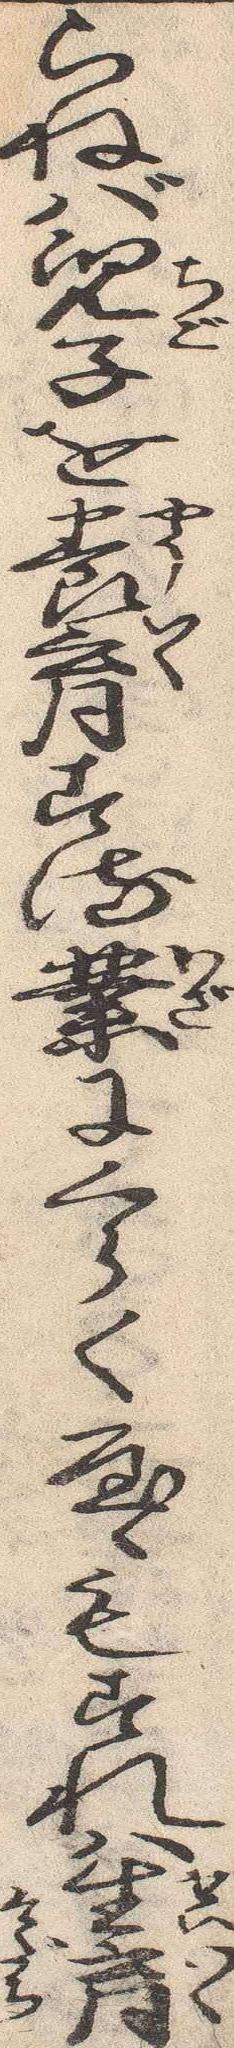らねば児子を養育する業にくらくやゝもすれは生育
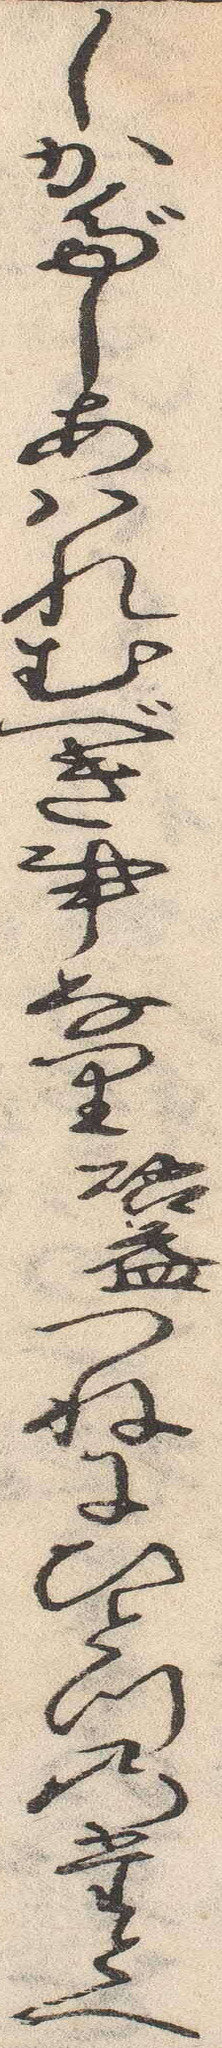しかだしあはれむべき事なり啓益つねにひとつのたとへ
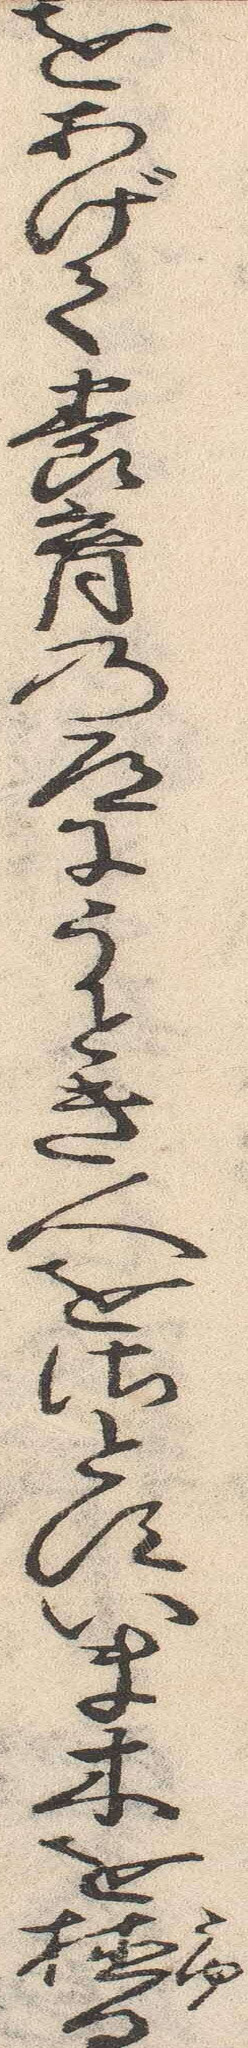をあげて養育の道にうとき人をさとすいま木を植る
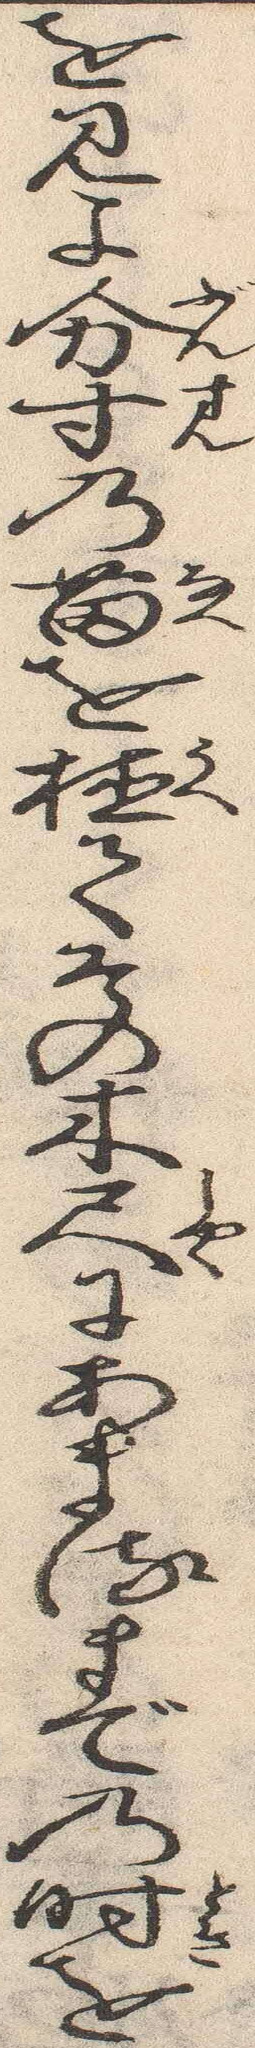を見よ分寸の苗を植てその木尺にあまるまでの時を
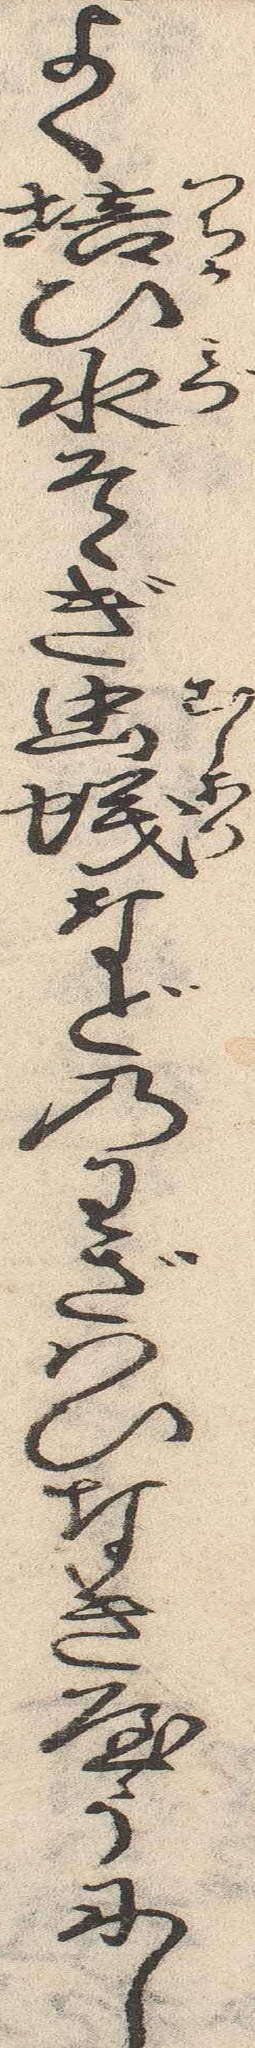よく培ひ水そゝぎ虫蟻などのわざはひなきやうにし
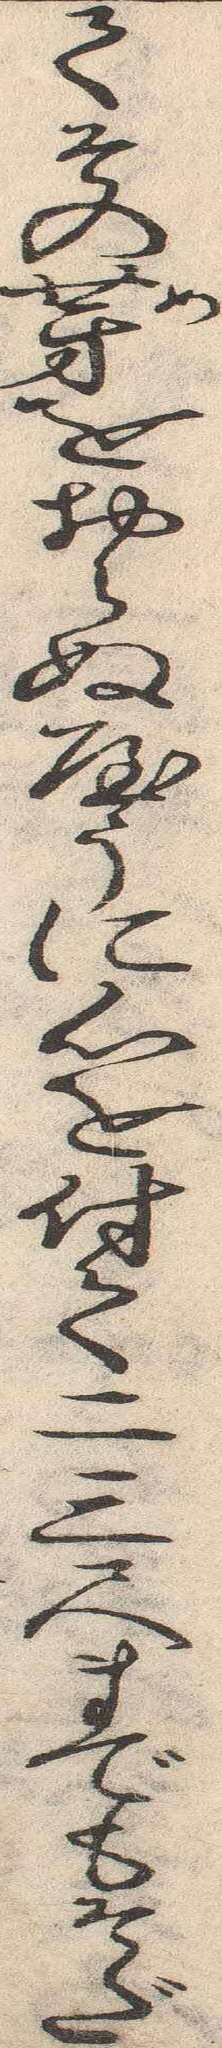てその芽をおらぬやうに心を付て二三尺までもそだ
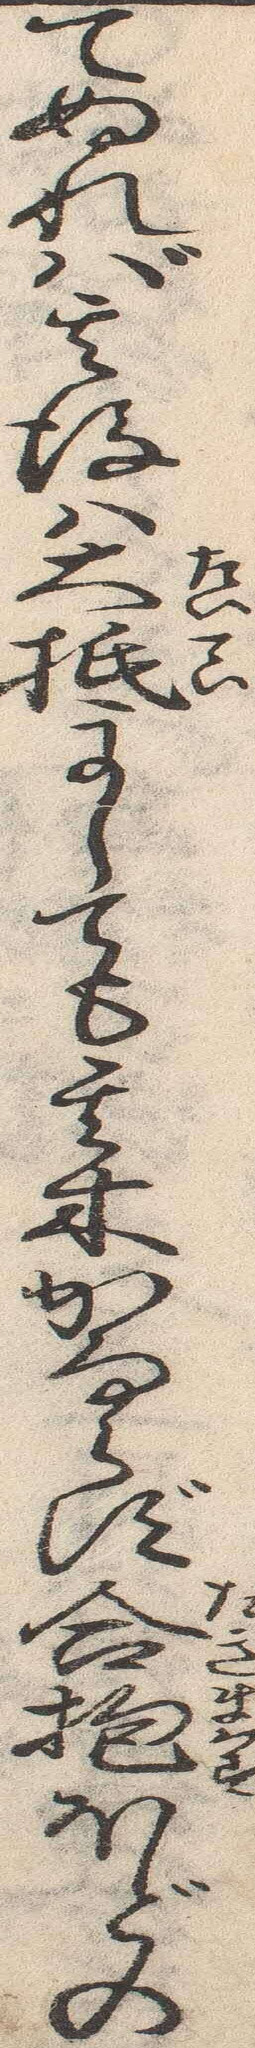てぬれば其後は大抵にしても其木かならず合抱ほどの
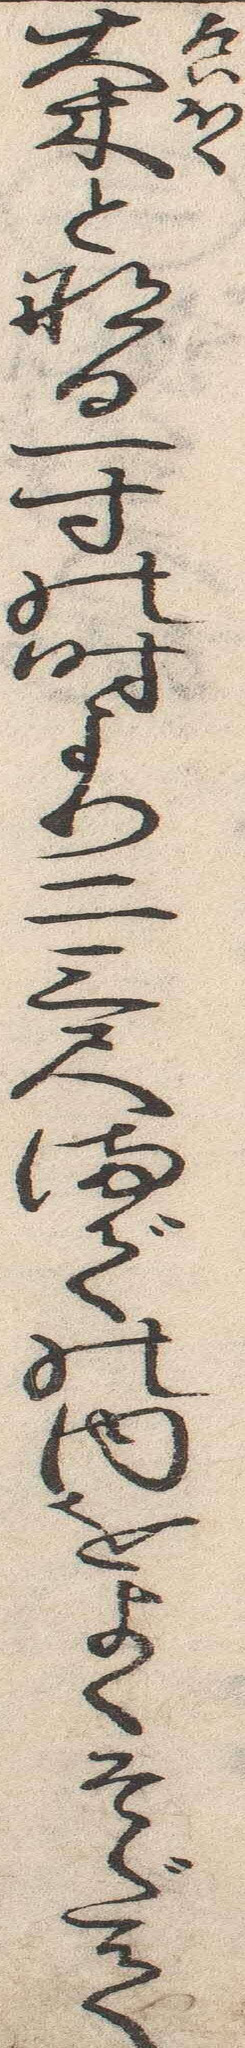大木となる一寸の時より二三尺までの内をよくそだて
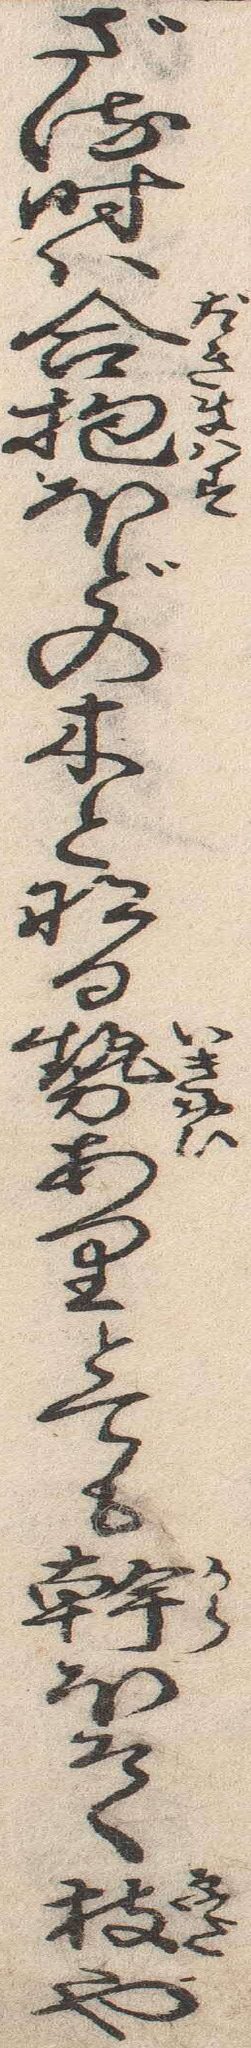ざるときは合抱ほどの木となる㔟ありとても幹ほそく枝や
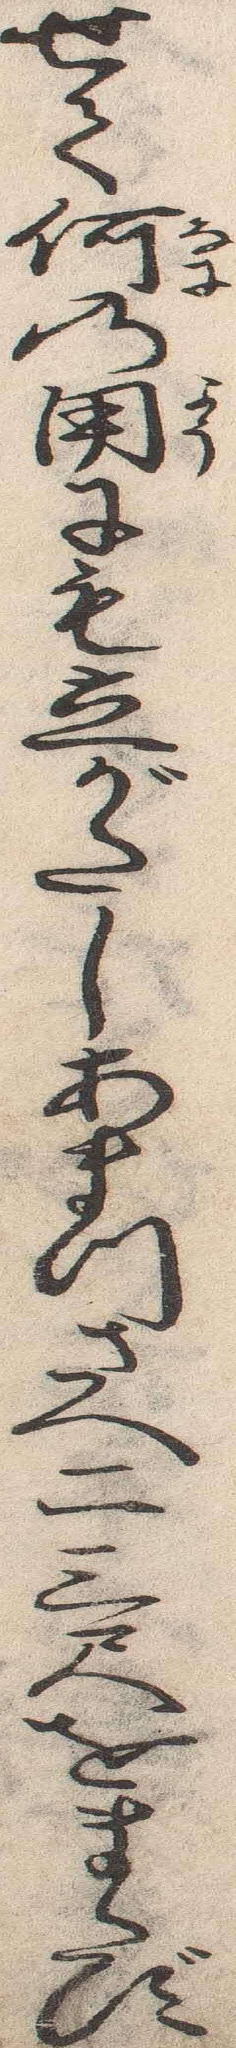せて何の用にも立ちがたしあまつさへ二三尺をまたず
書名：小児必用養育草
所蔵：東京学芸大学附属図書館 国文学研究資料館
